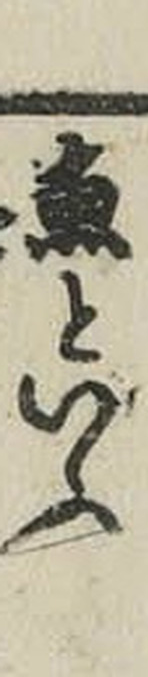魚といふ
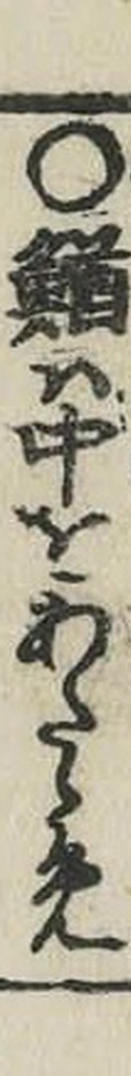○鰌は中をあたゝめ
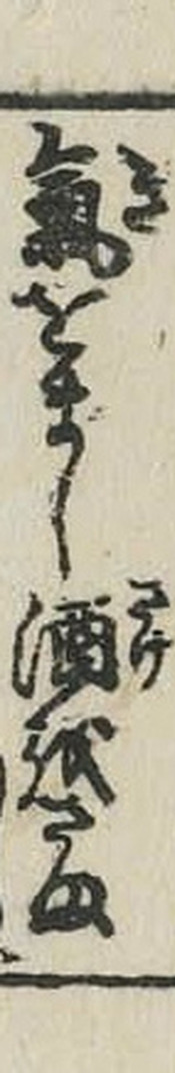気をまし酒をさまし
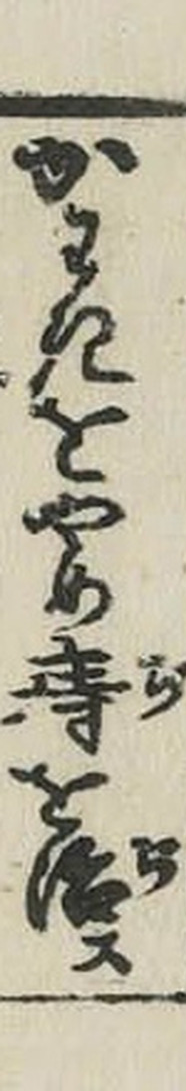かわきをやめ痔を治す
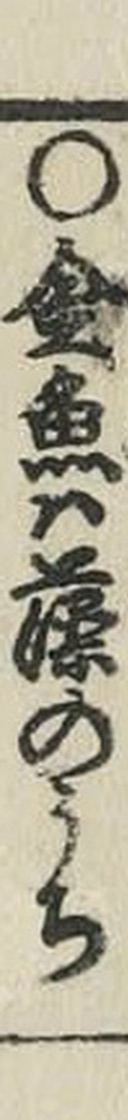○金魚は藻のうち
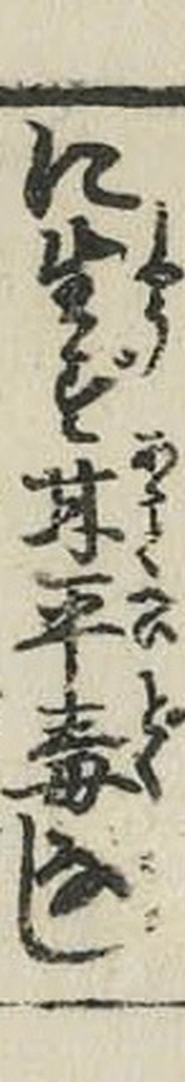に生ず甘平毒なし
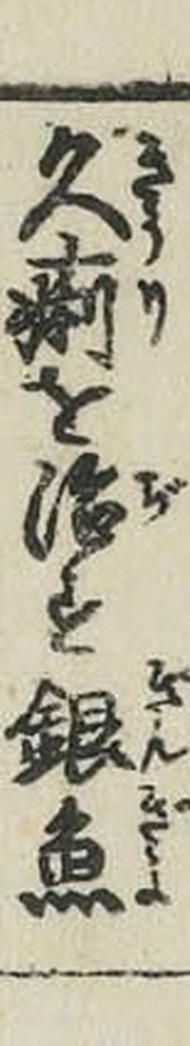久痢を治す銀魚
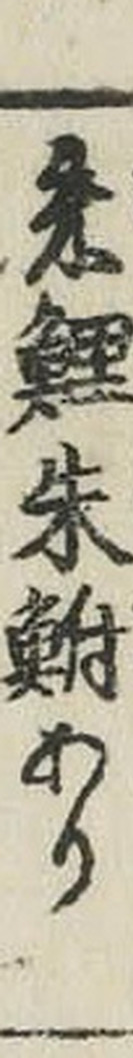朱鯉朱鮒あり
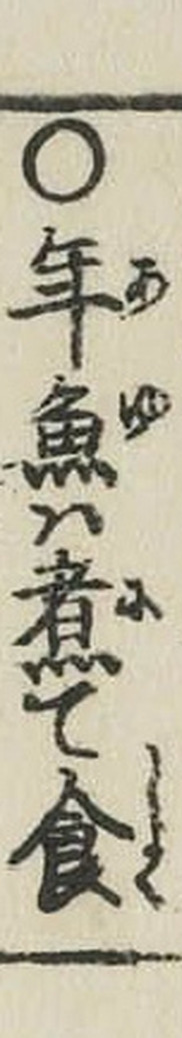○年魚は煮て食
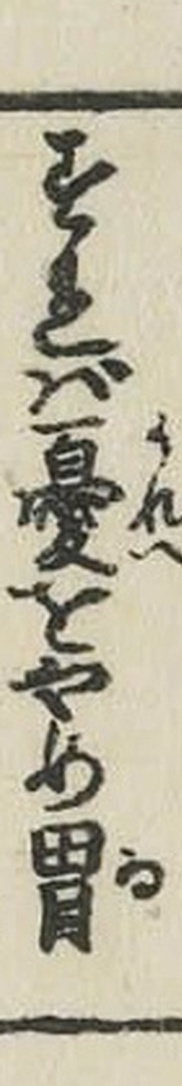すれば憂をやめ胃
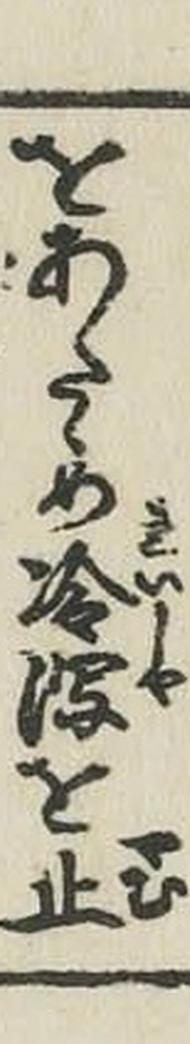をあたゝめ冷瀉を止
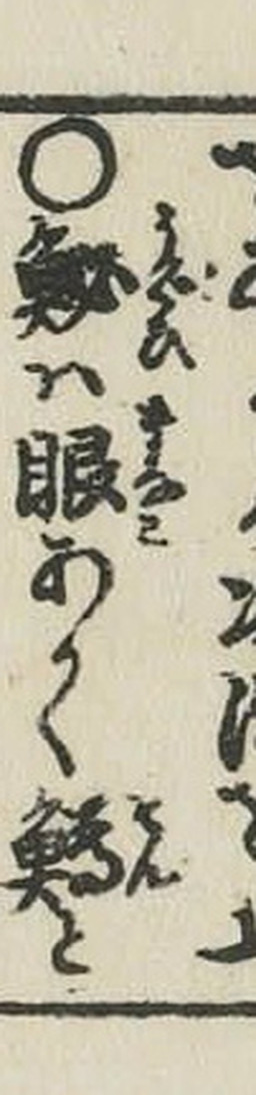○鮅は眼あかく鱒と
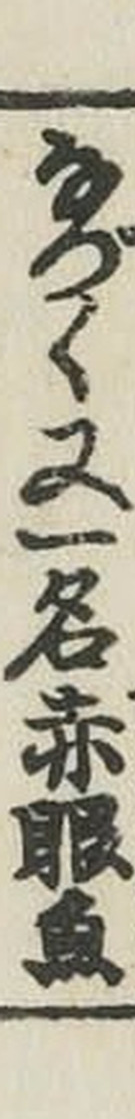なづく又一名赤眼魚
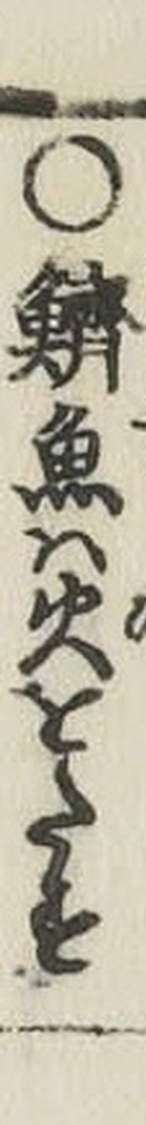○鱭魚は火をたす
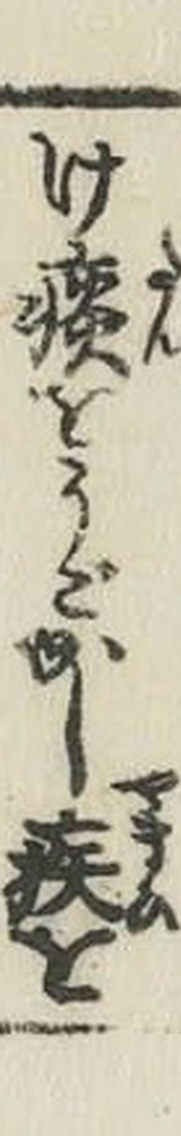け痰をうごかし疾を
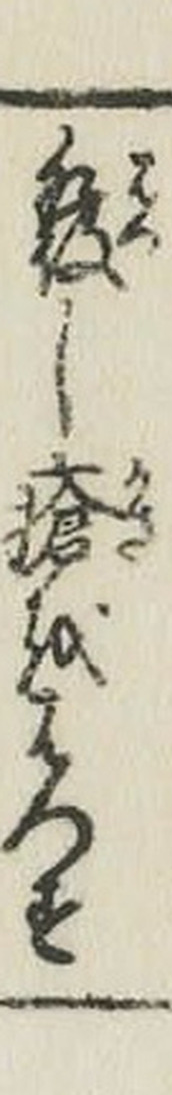発し瘡をはつす
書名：増補頭書訓蒙図彙大成 10巻 7:巻之14-16
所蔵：東京学芸大学教育コンテンツアーカイブ
